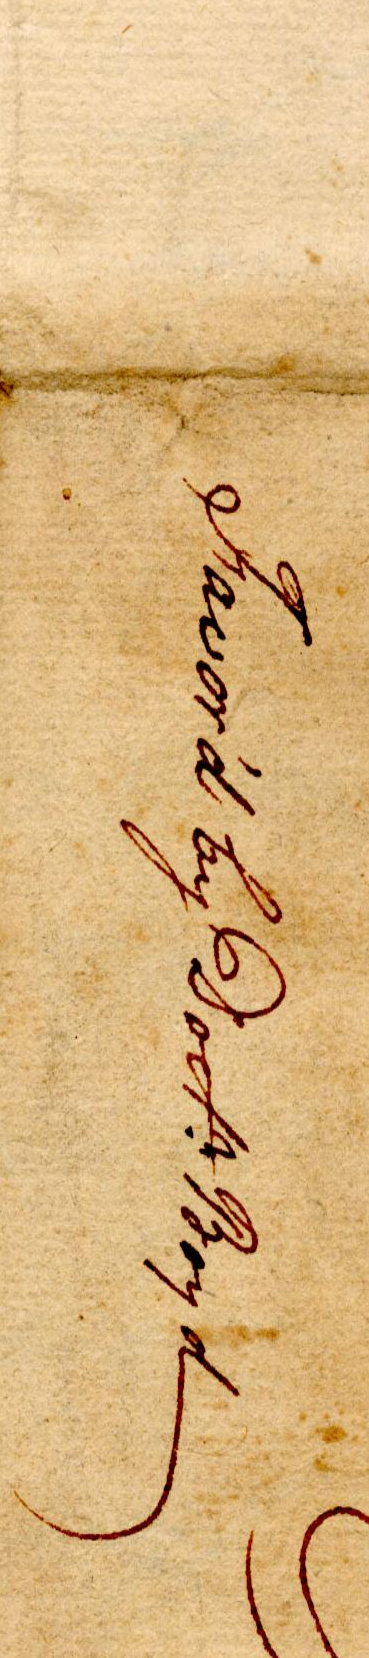Favor'd by Doct^r Boyd
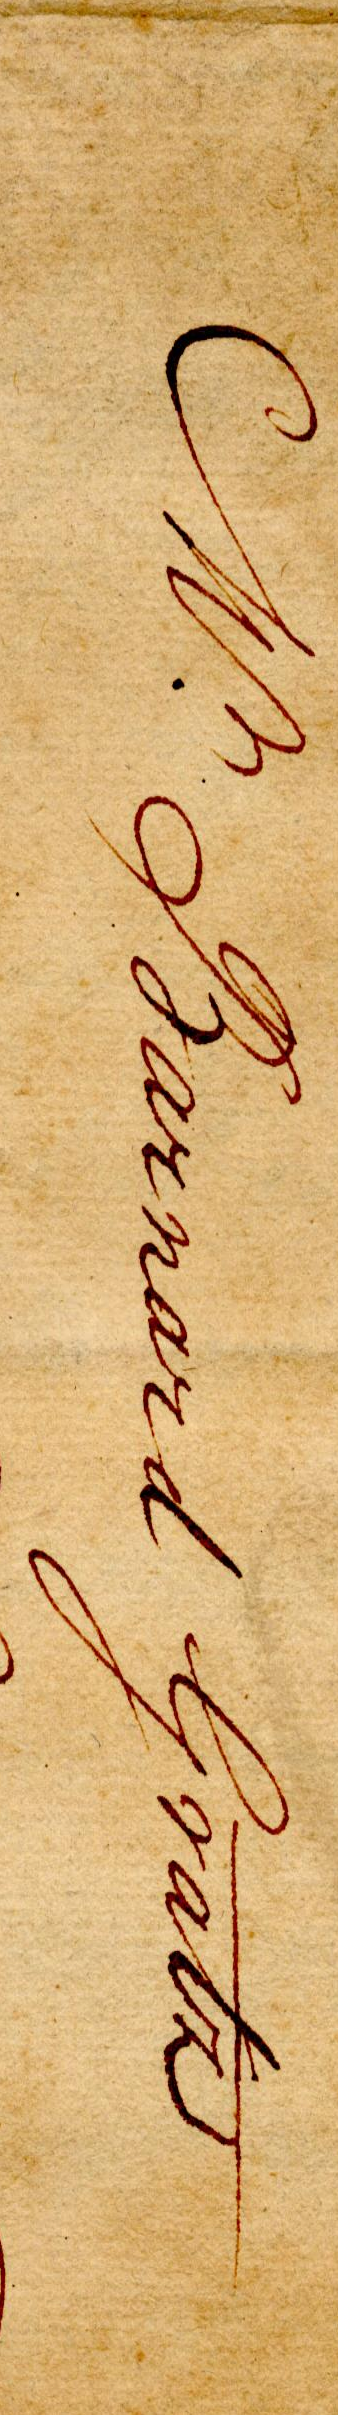M^r Barnard Gratz
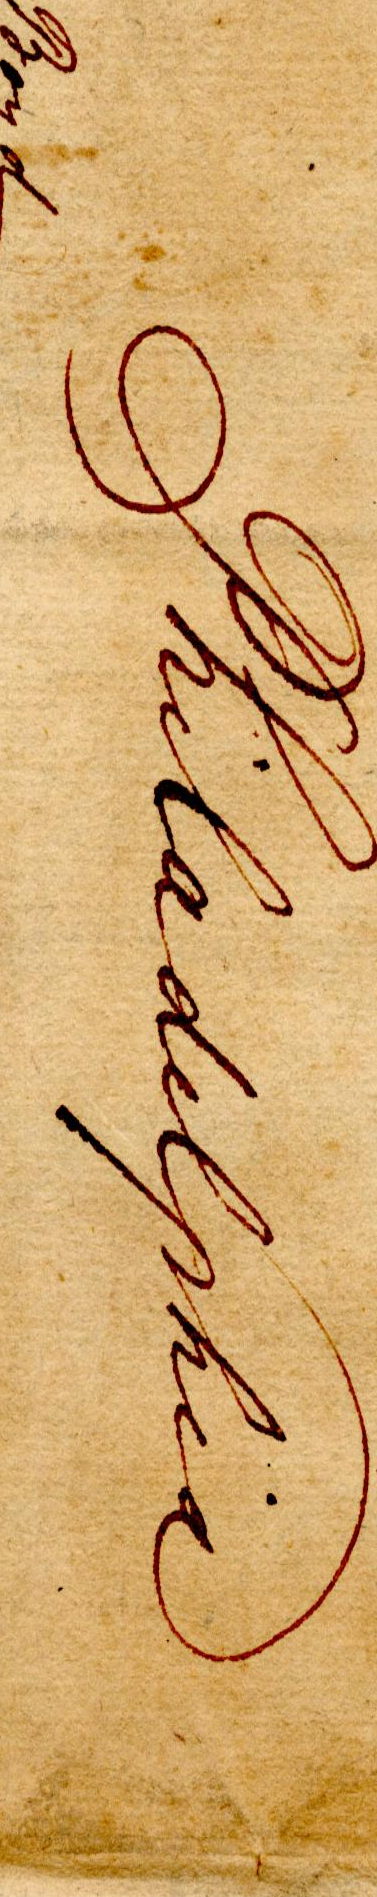Philadelphia
